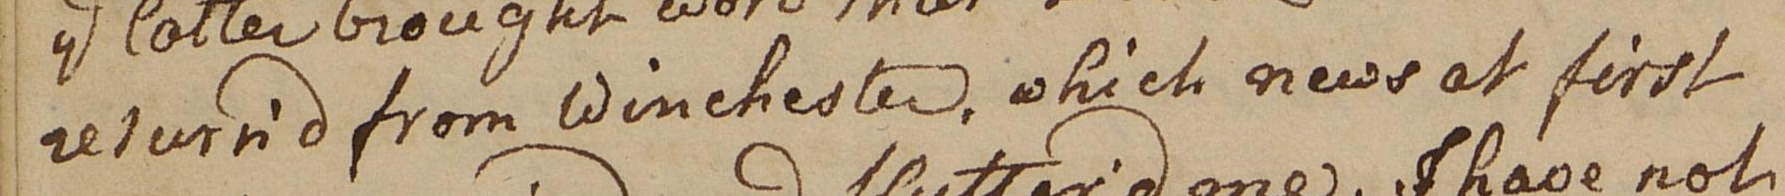return'd from Winchester, which news at first
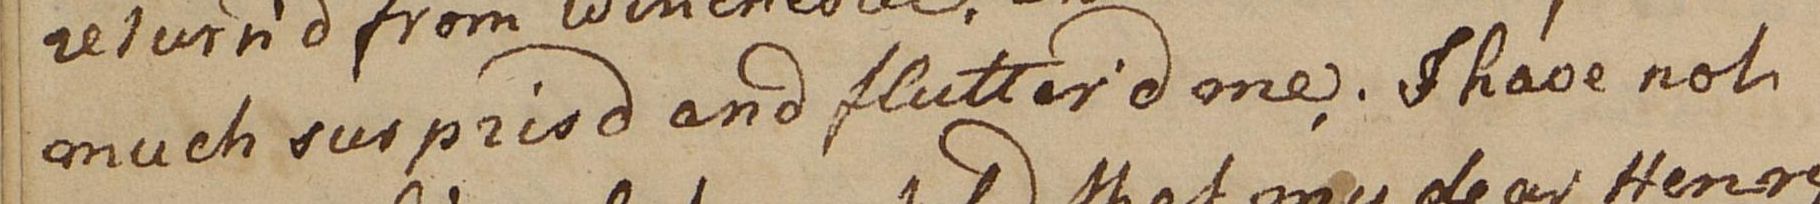much surprisd and flutter'd me. I have not
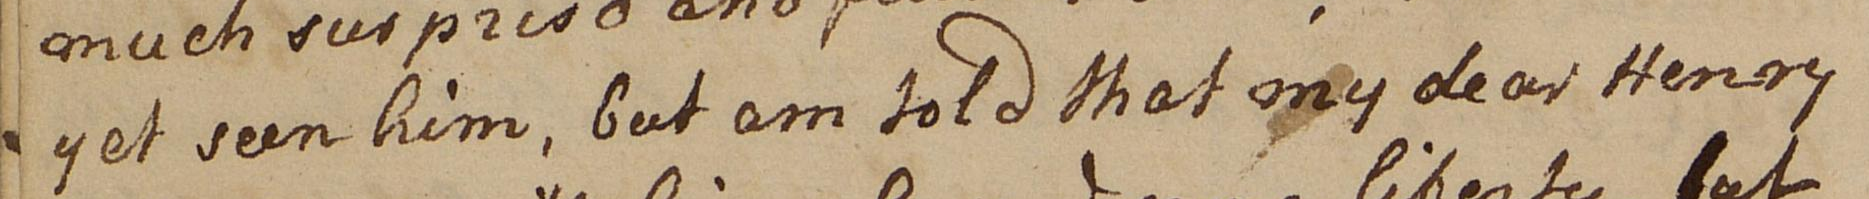yet seen him, but am told that my dear Henry
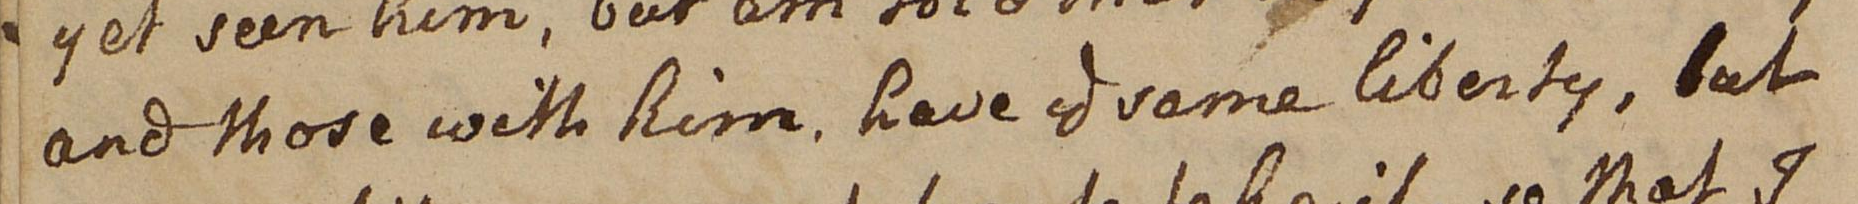and those with him. have y^e same liberty, but
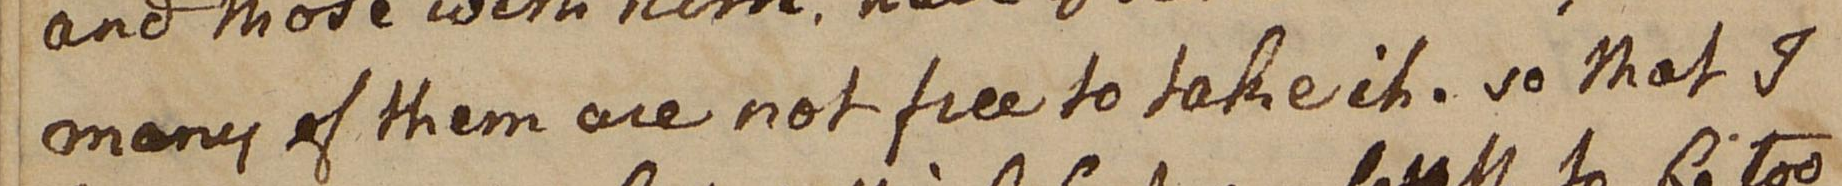many of them are not free to take it. so that I
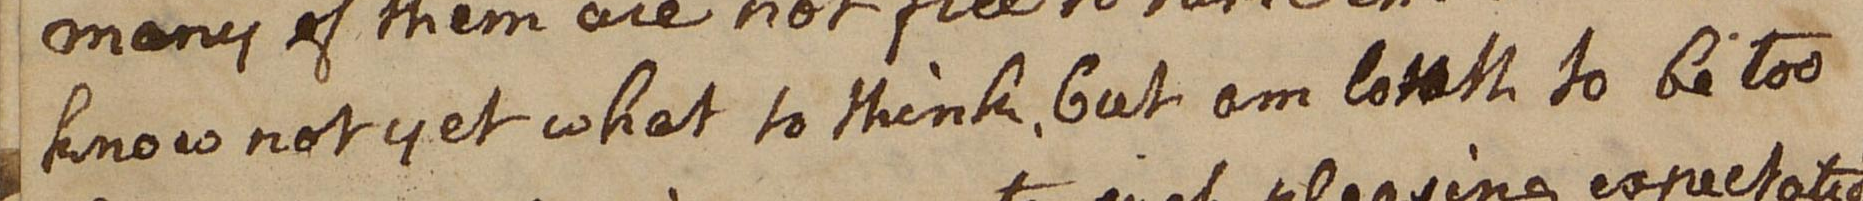know not yet what to think, but am lo[a]th to be too
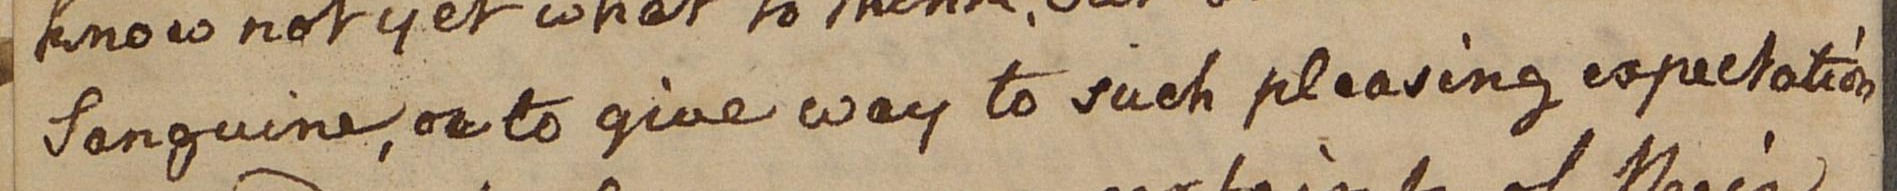Sanguine, or to give way to such pleasing expectation
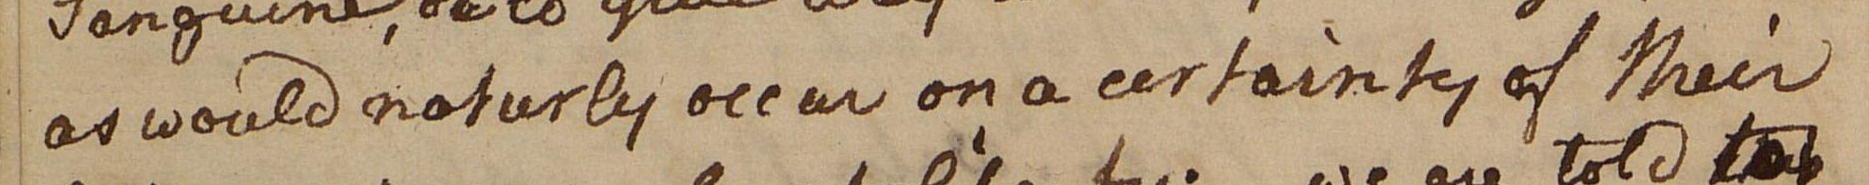as would naturly occur on a certainty of their
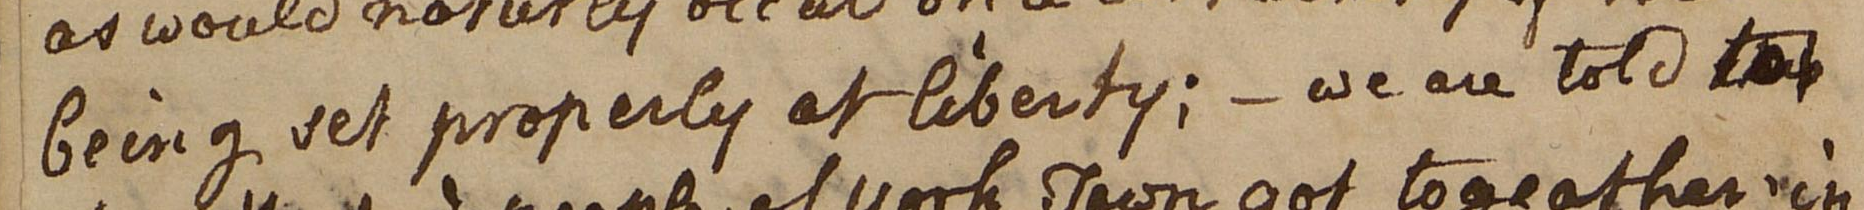being set properly at liberty;- we are told [to-]
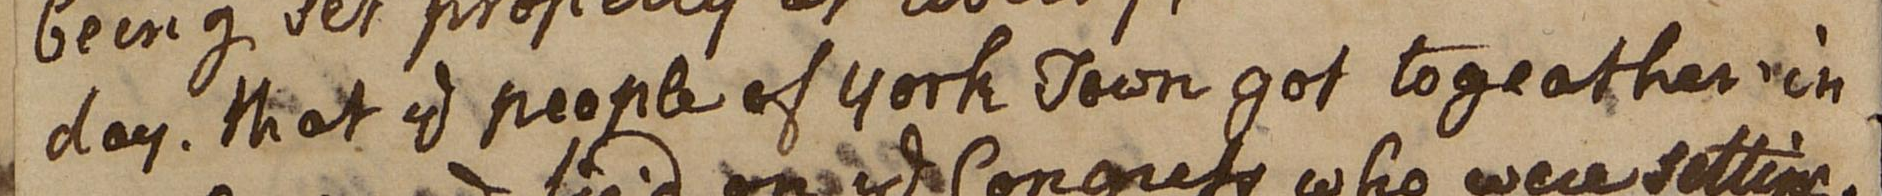day. that y^e people f York Town got togeather in
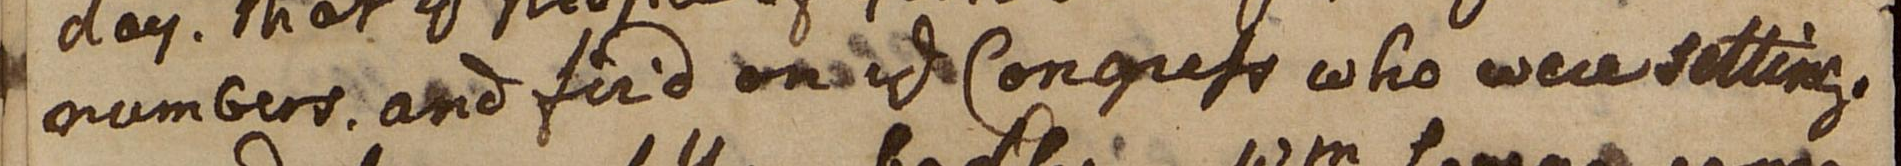numbers. and fir'd on y^e Congress who were setting.
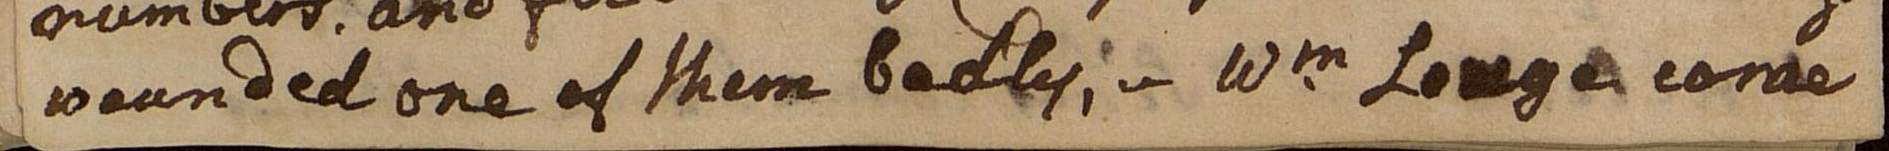wounded one of them badly,- W^m. Louge came
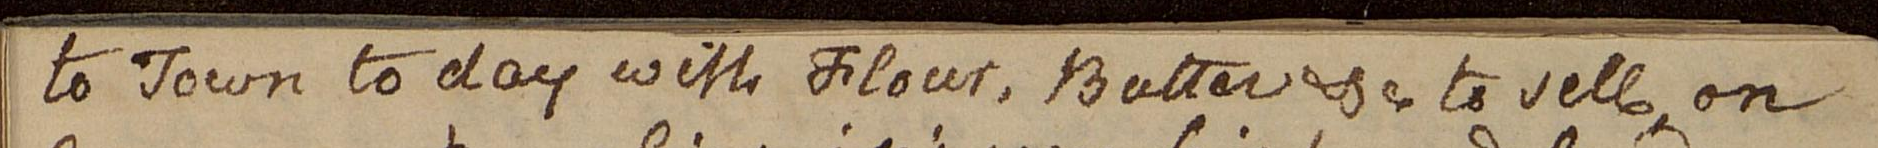to Town to day with Flour, Butter &c to sell, on
